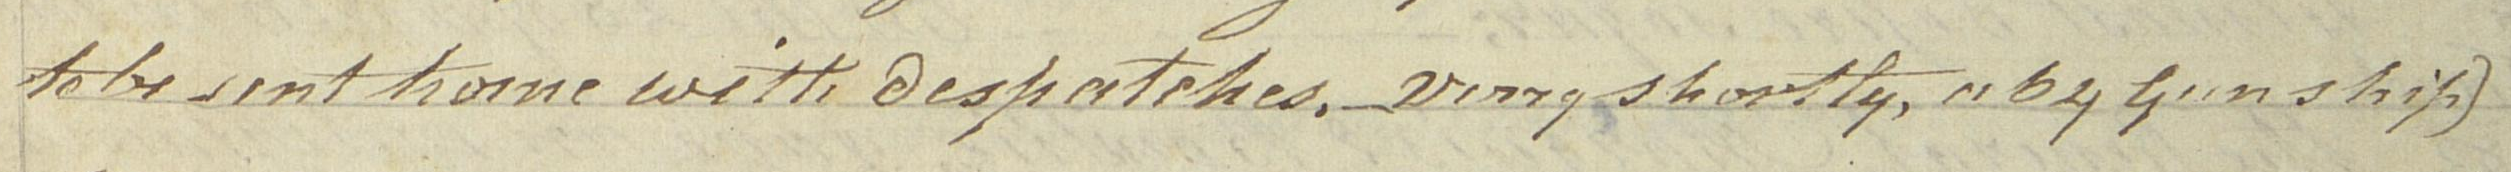to be sent home with despatches, verry shortly, a 64 Gunship)
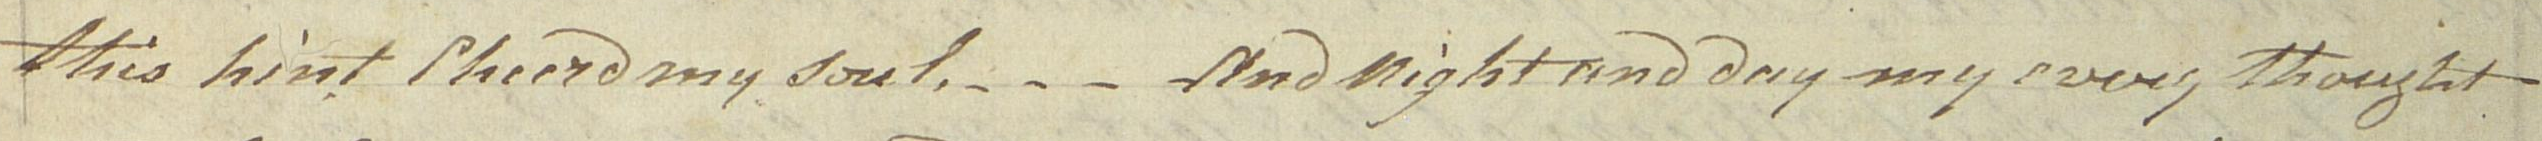this hint Cheerd my soul And night and day my every thought
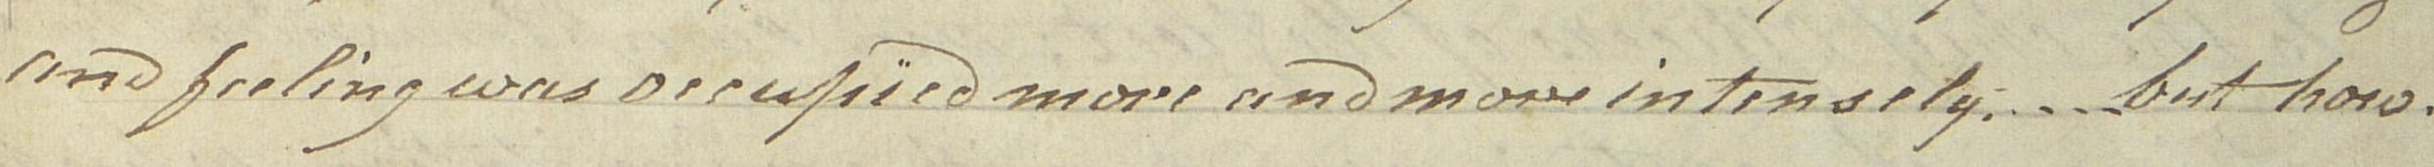and feeling was occupied more and more intensely: but how
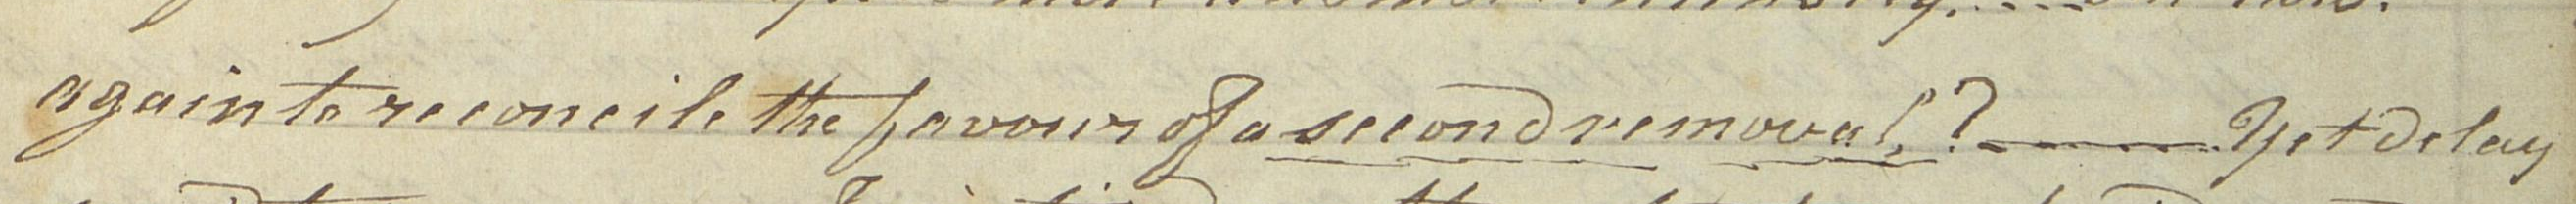again to reconcile the favour of a second removal? Yet delay
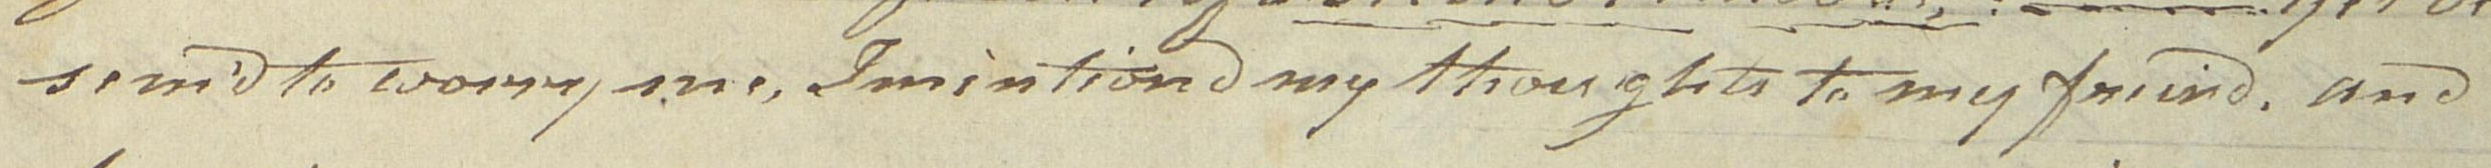sem'd to worry me I mentiond my thoughts to my friend, and
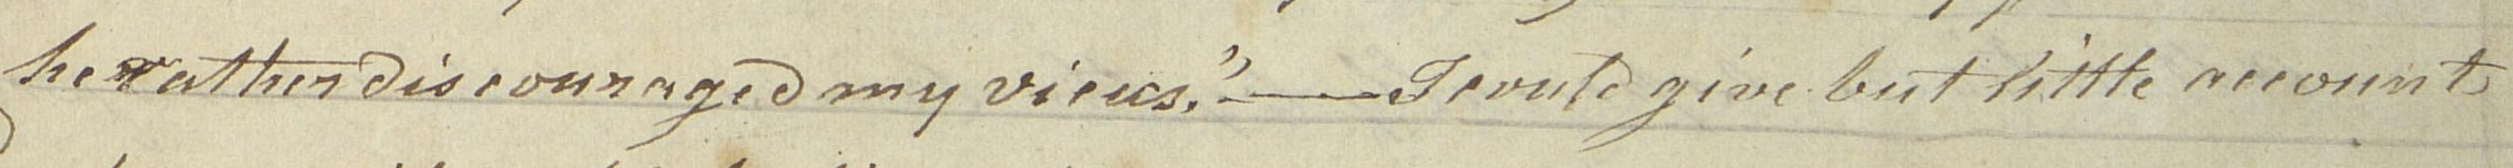he rather discouraged my vices," I could give but little recount
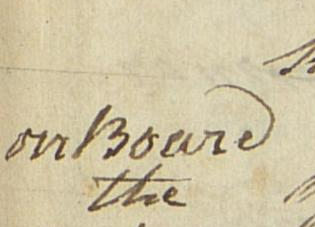on Board
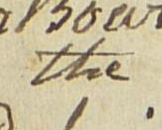the
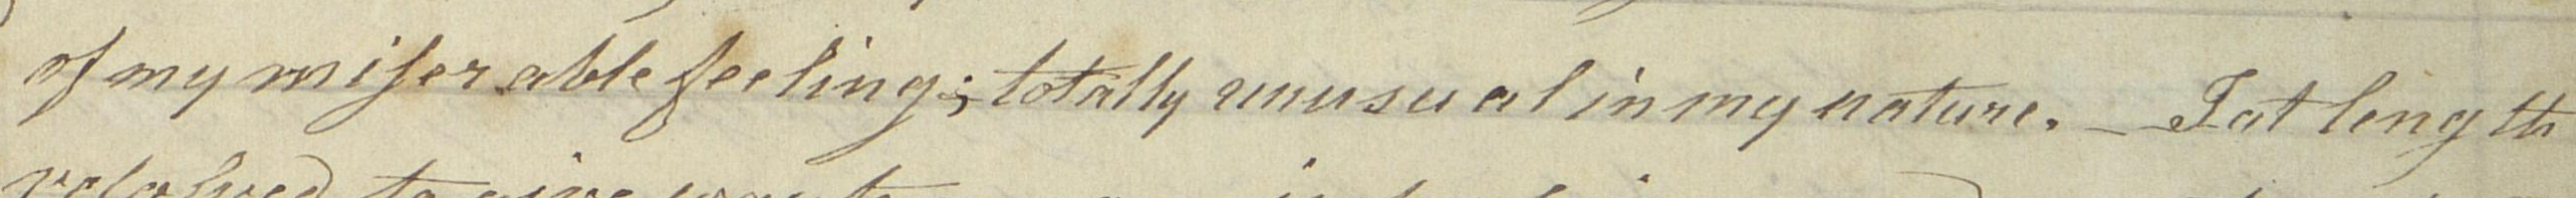of my miserable feeling; totally unusual in my nature. I at length
